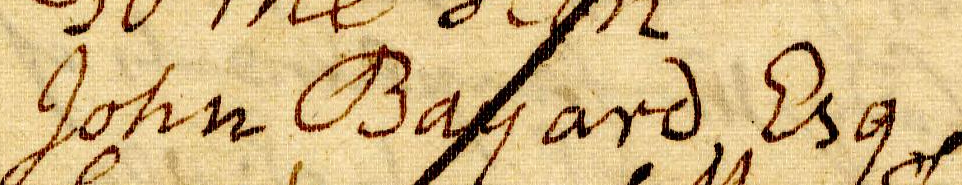John Bayard, Esq
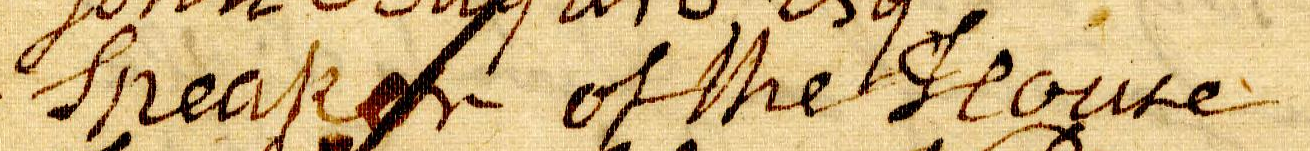Speaker of the House
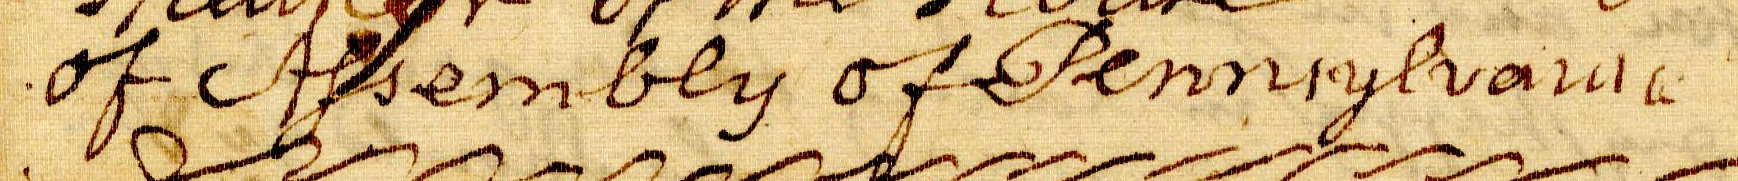of Assembly of Pennsylvania
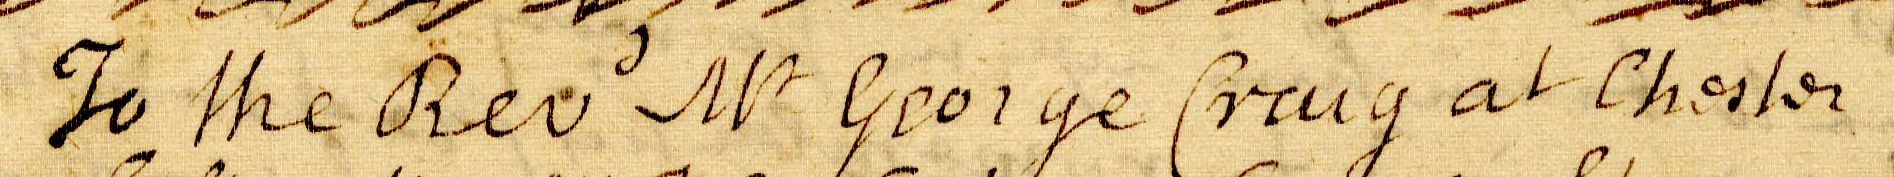To the Rev^d M^r George Craig at Chester
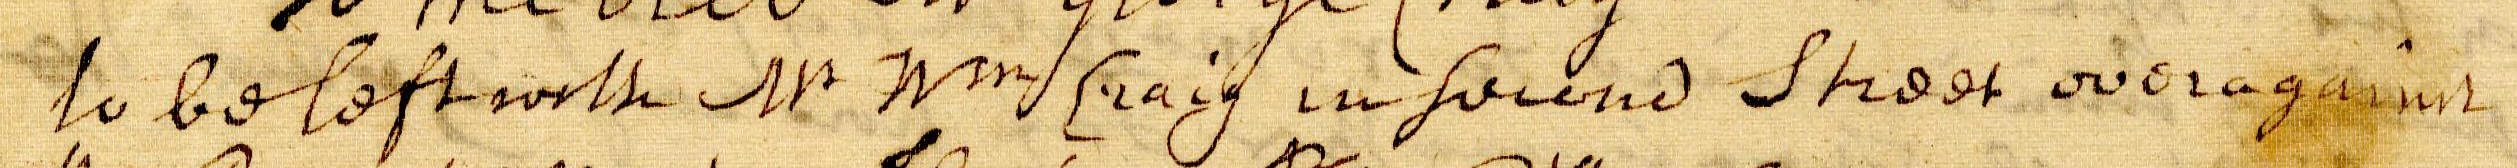to be left with M^r W^m Craig in Second Street over against
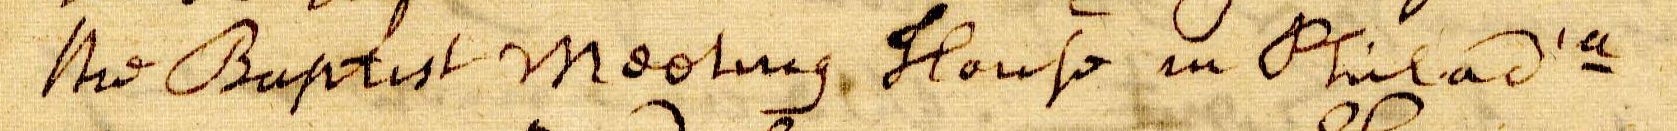the Baptist Meeting House in Philad^a.
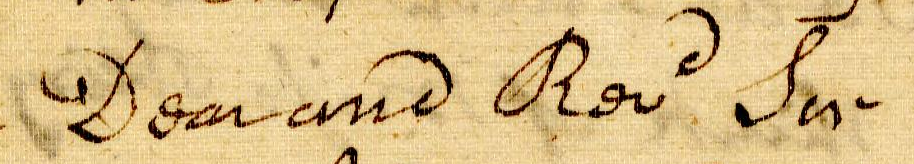Dear and Rev^d Sir
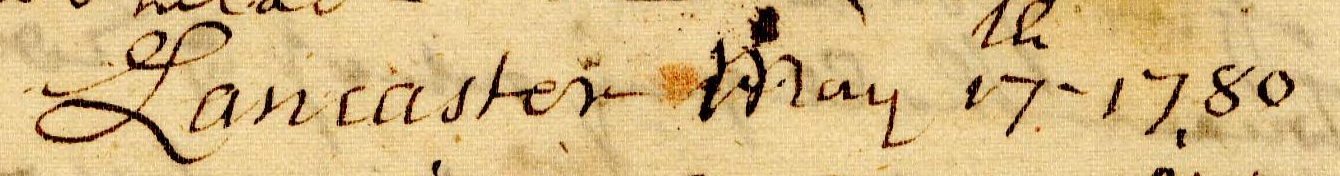Lancaster May 17^th- 1780
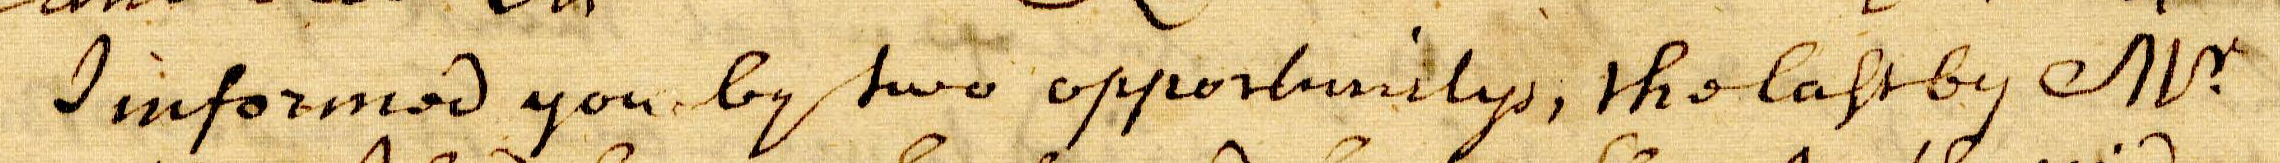I informed you by two opportunitys, the last by M^r.
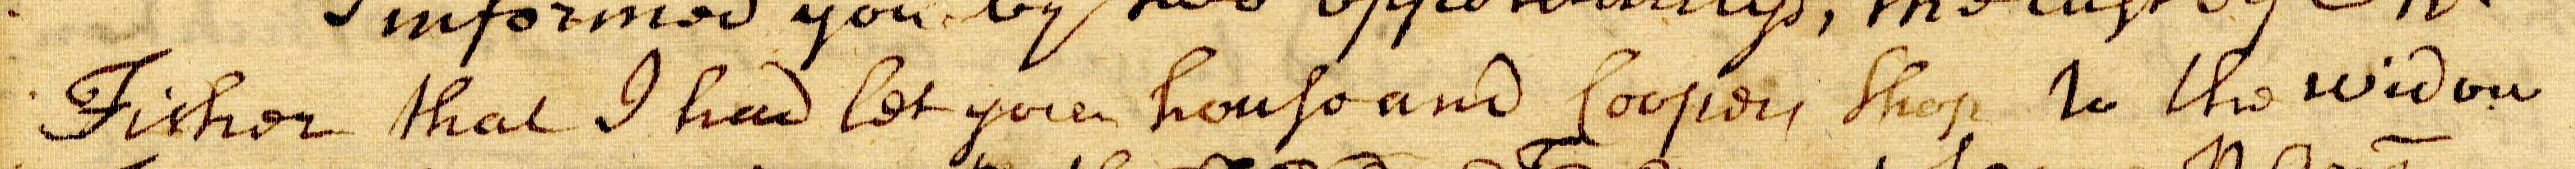Fisher that I had let your house and Coopers Shop to the Widow
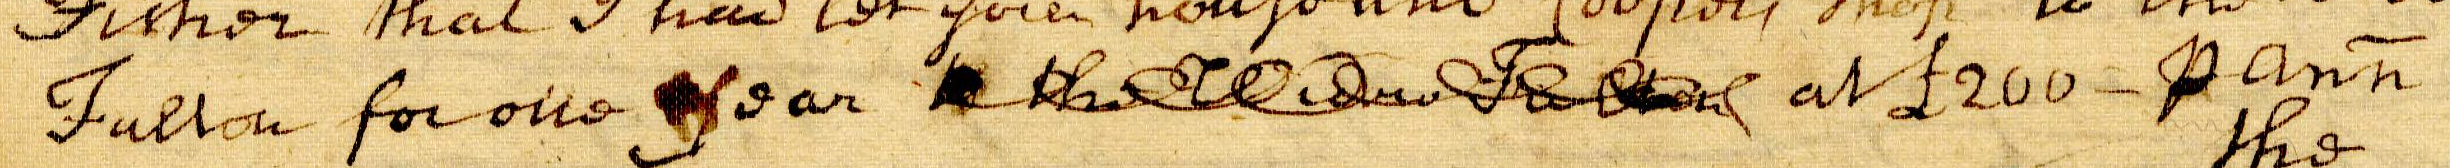Fulton for one year [the Widow Fulton] at £200- per Ann
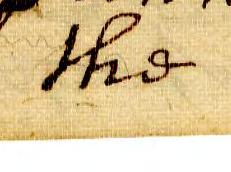the
